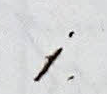1.
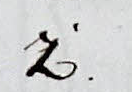2.
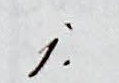1.
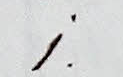1.
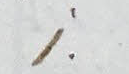1.
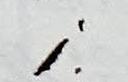1.
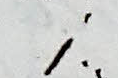1.
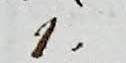1.
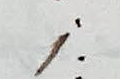1.
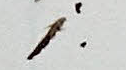1.
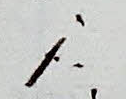1.
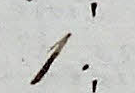1.
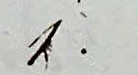1.
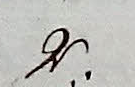2.
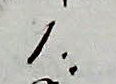1.
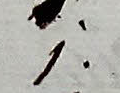1.
